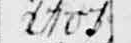2703
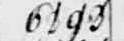6193
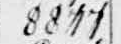8877
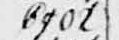6902
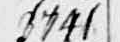3741
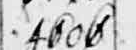4606
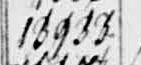13933
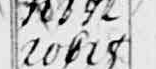20625
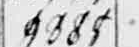9385
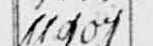11907
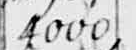4000
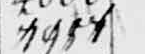7957
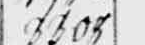3305
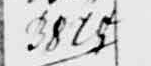3825
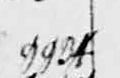9934
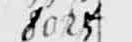8025
